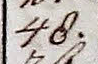48.
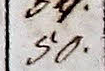50
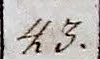43.
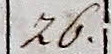26
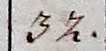32
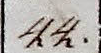44
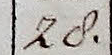28.
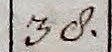38.
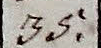35.
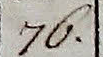76.
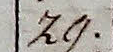29
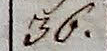36
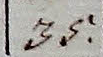35.
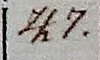47.
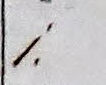1.
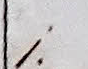1.
